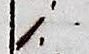1.
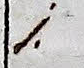1.
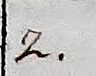2.
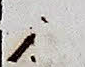1.
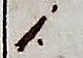1.
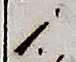1.
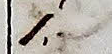1.
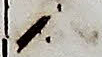1.
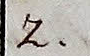2.
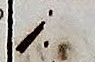1.
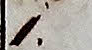1.
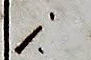1.
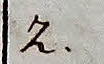2.
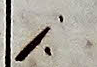1.
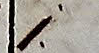1.
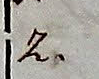2.
